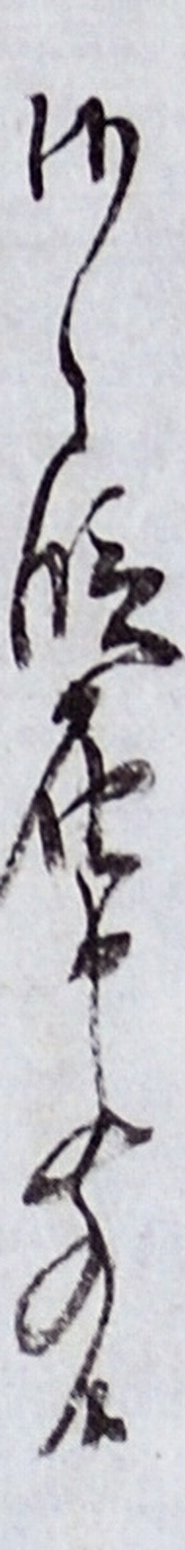哉之段届申聞候
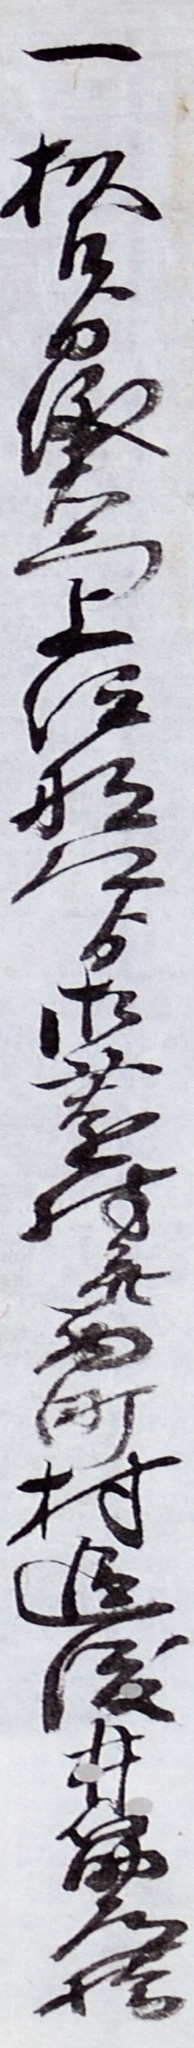一杉左衛門儀右衛門上伊那郷より御小蕪村并西町村追渡井筋道橋
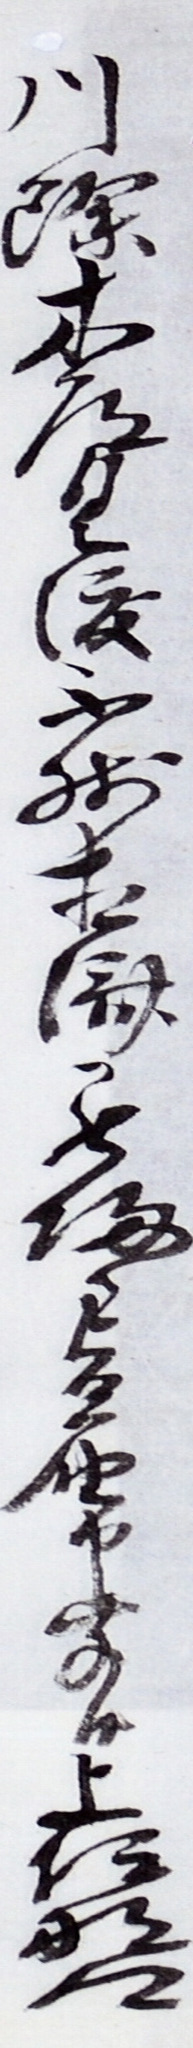川際木道具渡不残候相済罷帰旨届申聞候上伊那郷
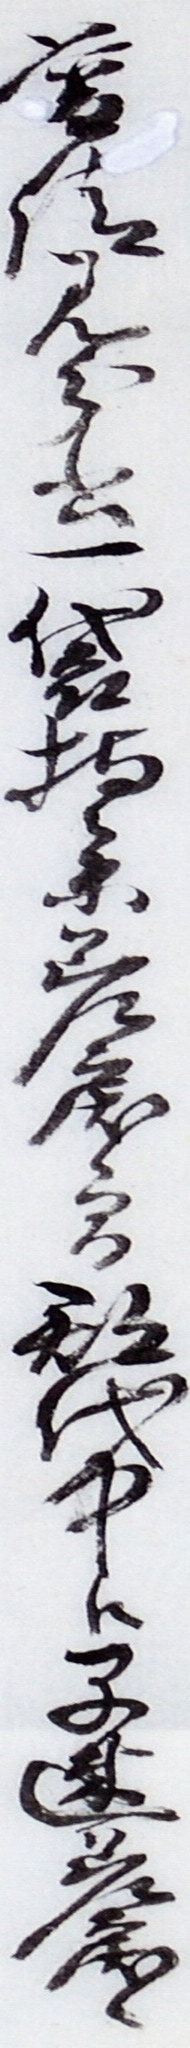普請見分書一袋持参差戻候間郡代中江早速差戻候
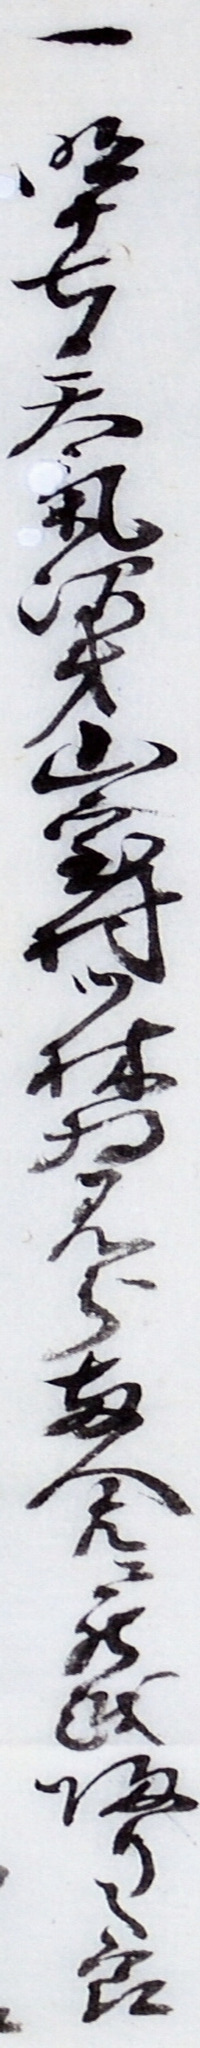一明十七日天気次第山室村御林為見分両人共ニ罷越帰り之節
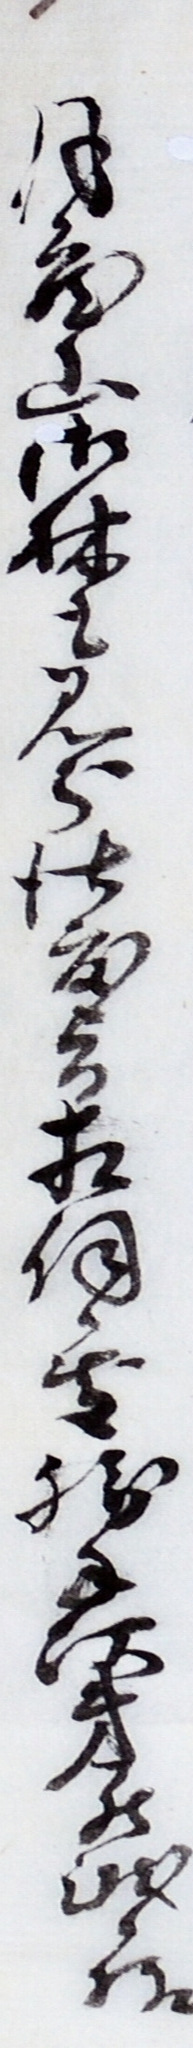月蔵山御林も見分仕度旨相伺候処勝手次第罷出候様
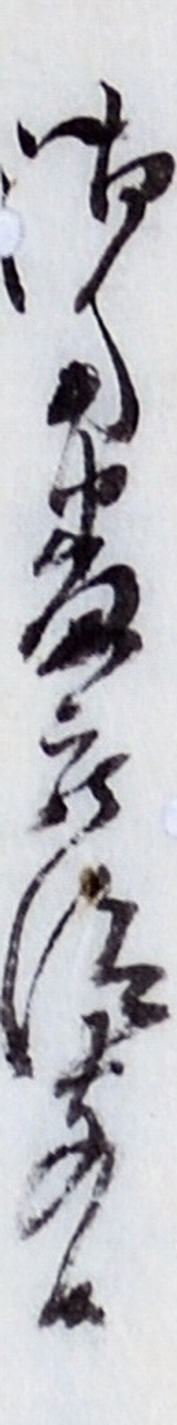御用番被仰聞候
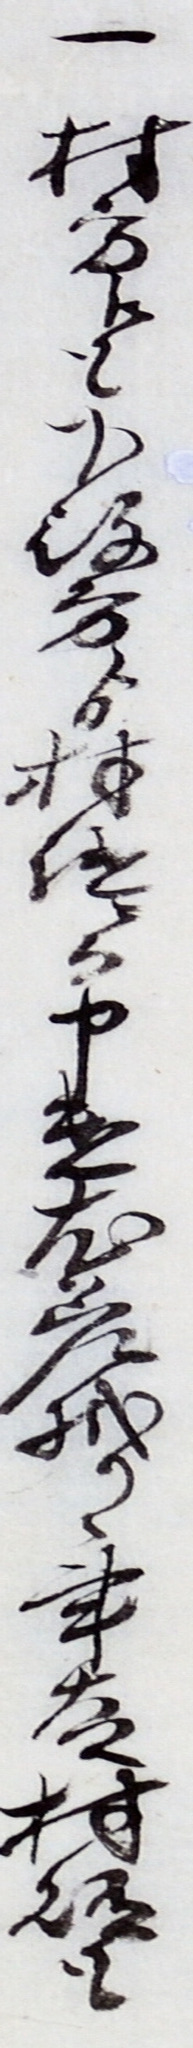一村方江も下諏方より村伝ニ而申遣尤差掛り候事故村賄も
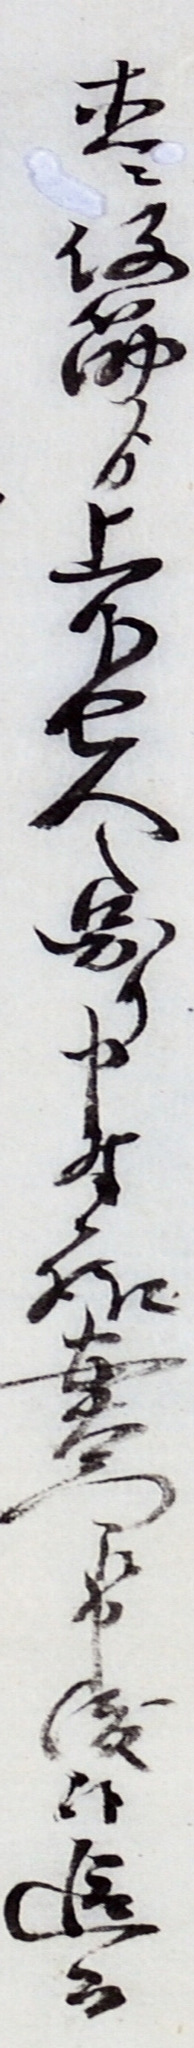直二仮筋より上下七人之図り申付候様安右衛門江申渡候追而
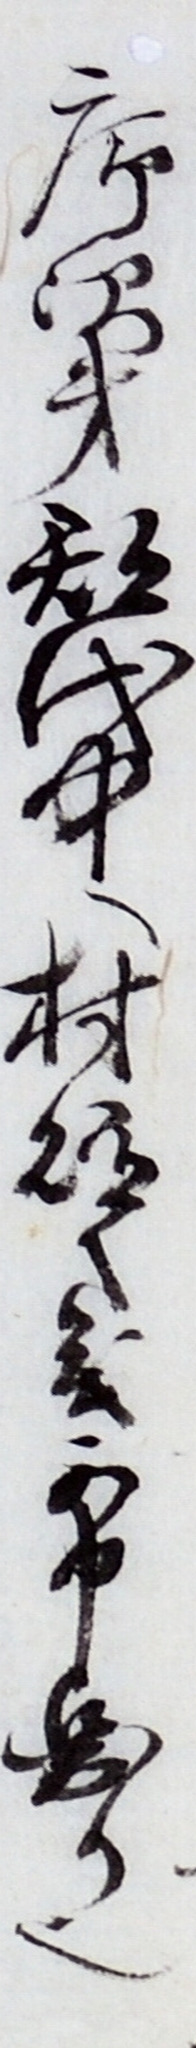序次第郡代中へ村賄之義可申図り也
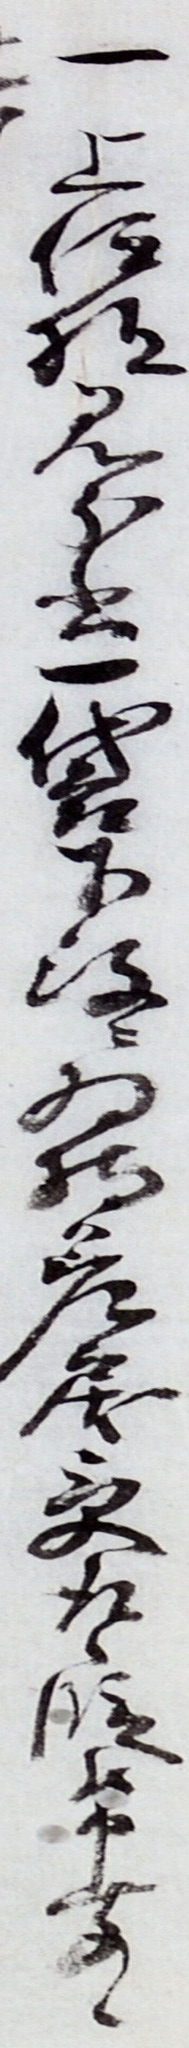一上伊那見分書一袋下役ニ為持差戻受取候段被申聞候
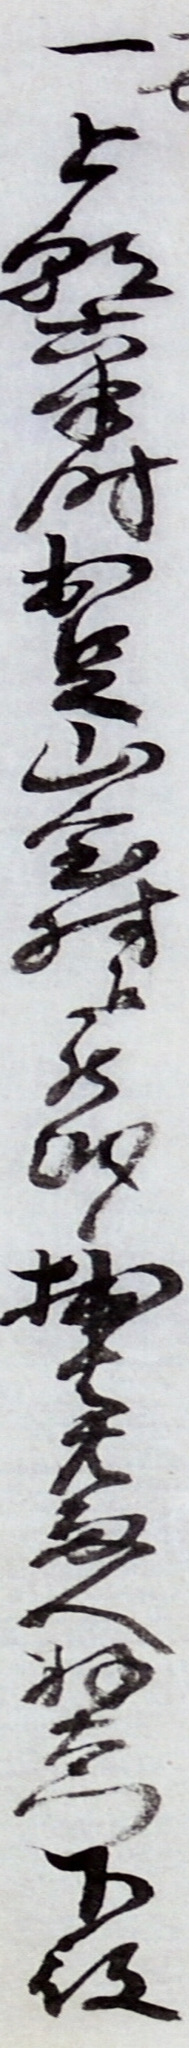一今朝六半時出足山室村江罷越候拙者共両人羽右衛門下役
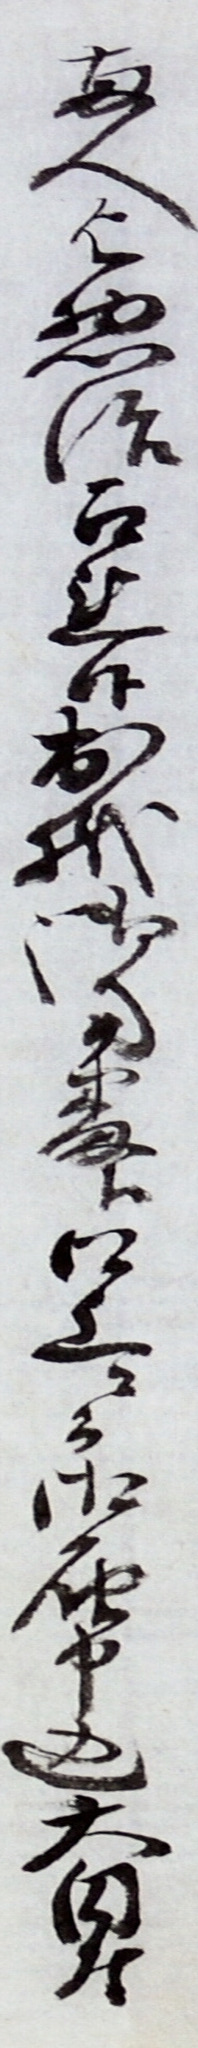両人与惣治召連候出掛御用番江口上ニ而御届申込大目付
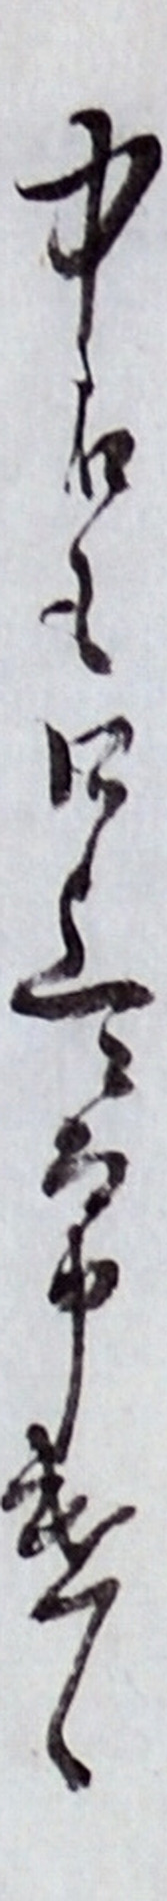中江も口上ニ而申遣候
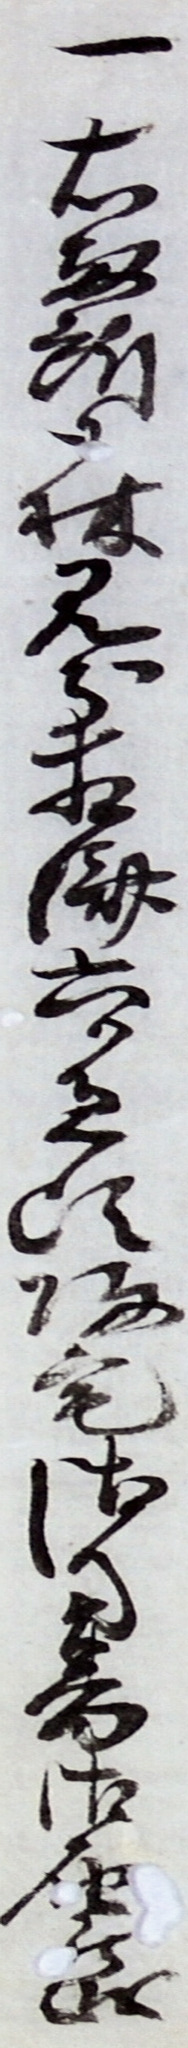一右両所御林見分相済六ツ過頃帰宅御用番御届被儀
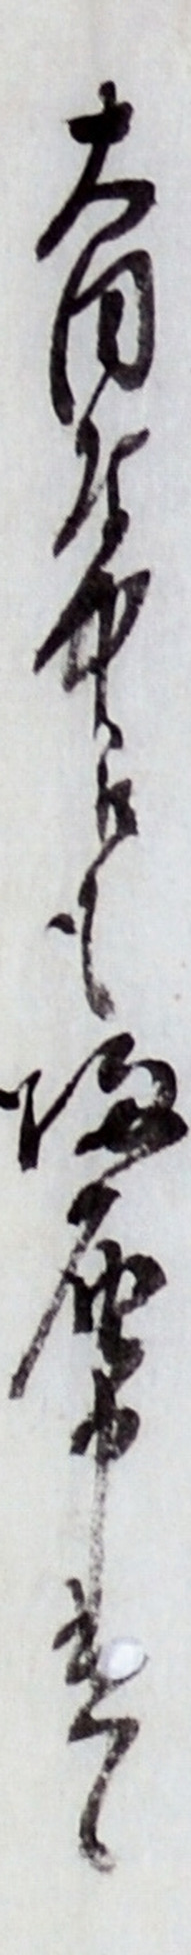大目付中江も帰届申遣候
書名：御山奉行御用控
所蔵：伊那市立高遠町図書館・合同会社AMANE
